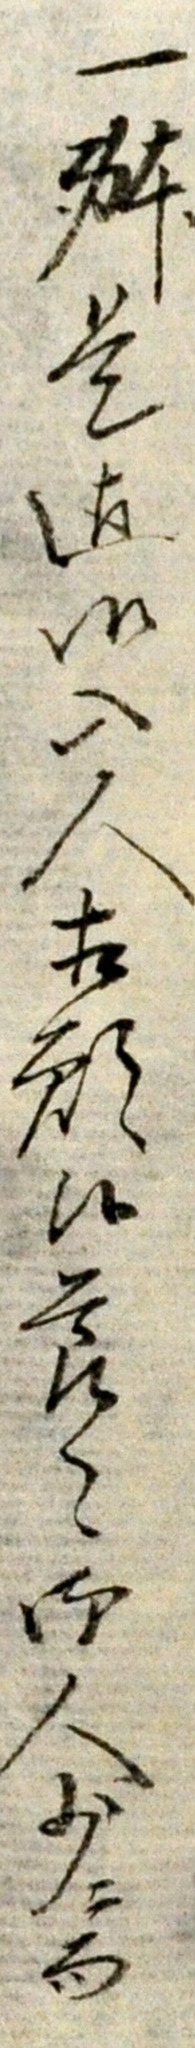一躰是迄御入人数相願候節々御人少ニ而
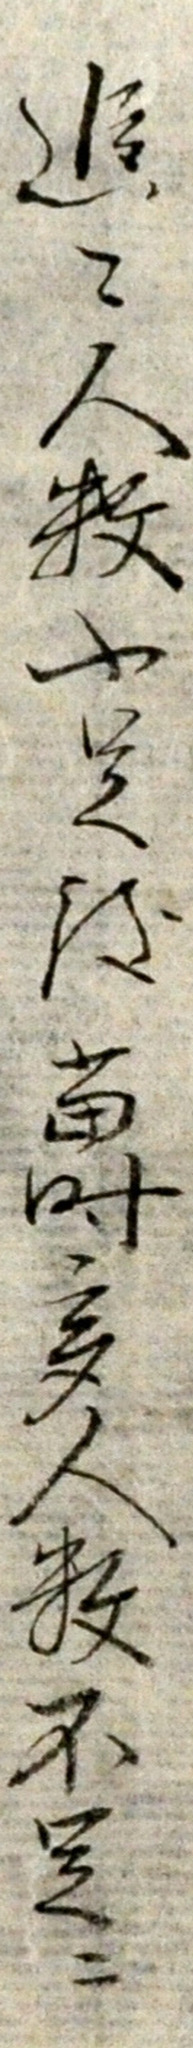追々人数不足致当時多人数不足ニ
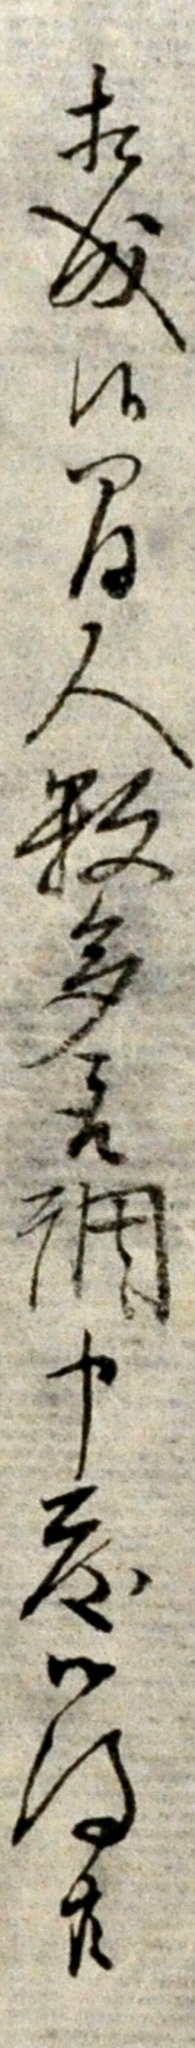相成候間人数多取調申度候得共
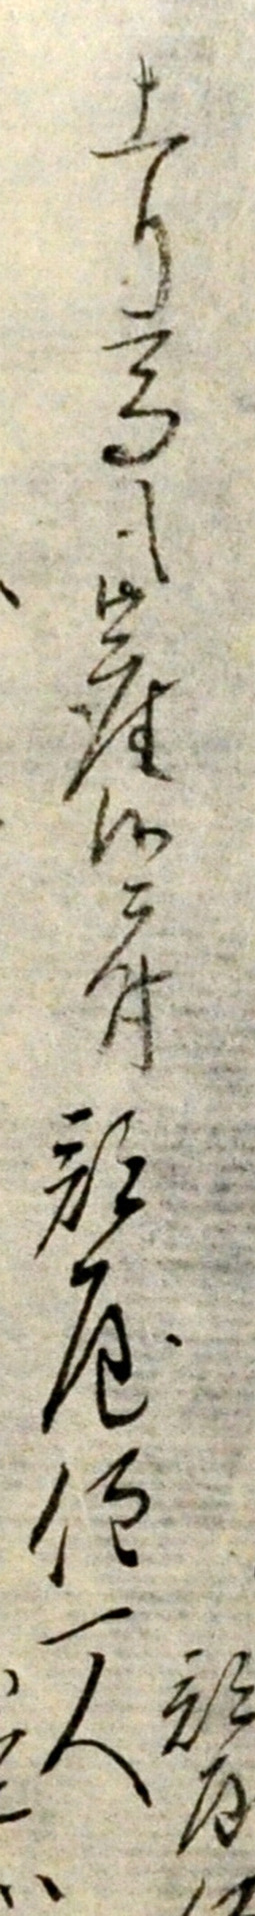上り高も御座候ニ付部屋住一人差加
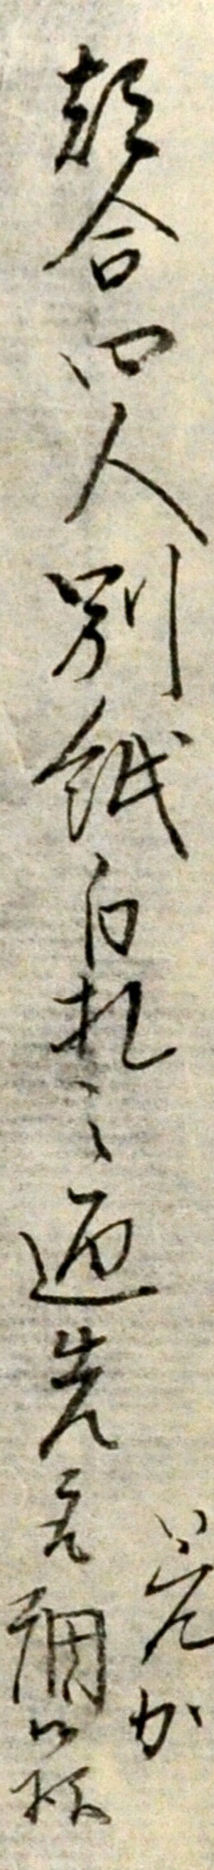都合四人別紙白札之通先取調候等様
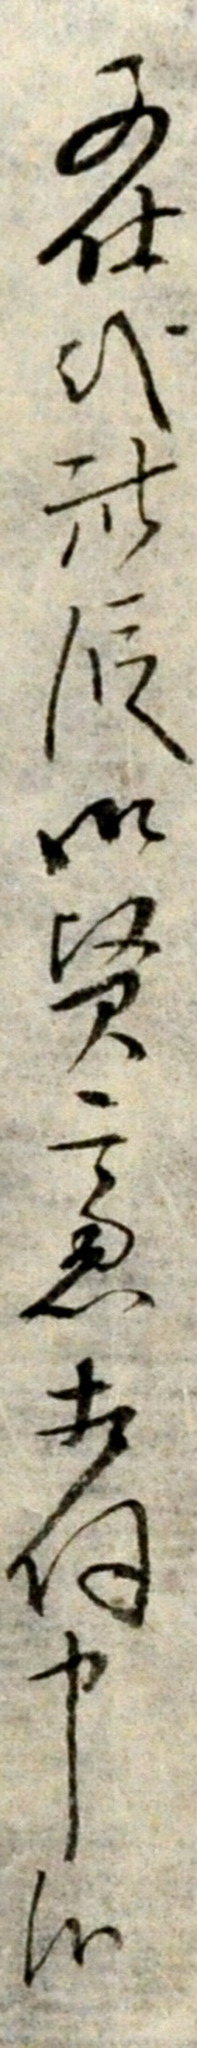可仕哉此段御賢慮相伺申候
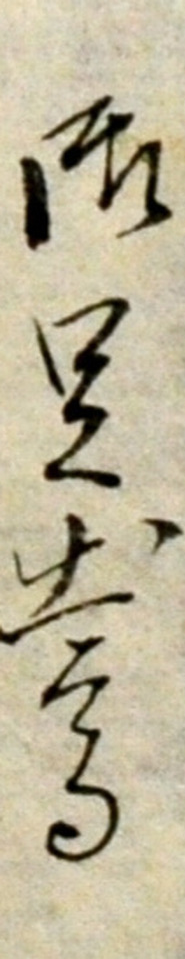御足出高
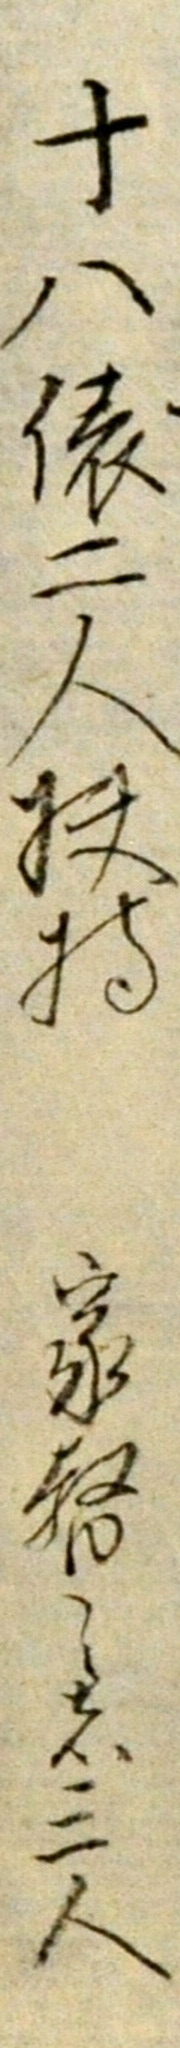十ハ俵二人扶持家督之者三人

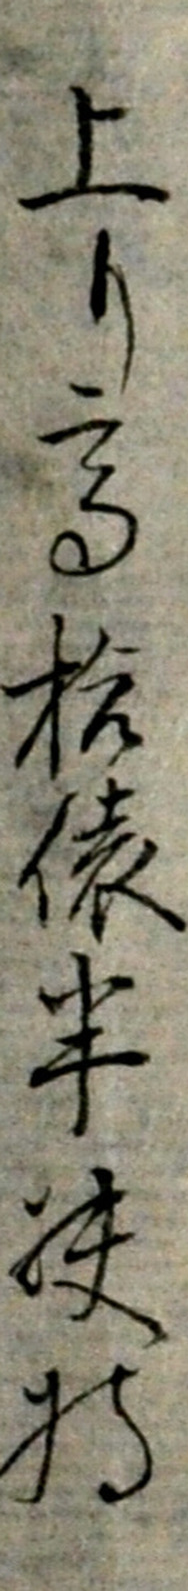上リ高拾俵半扶持
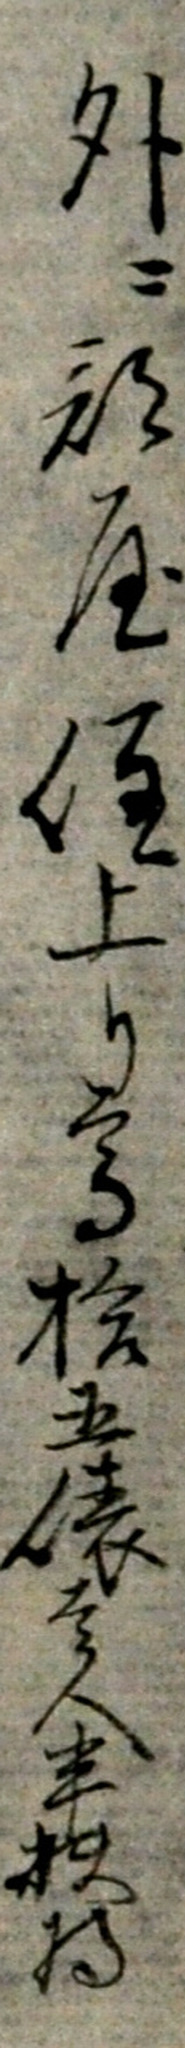外ニ部屋住上リ高十五俵一人半扶持
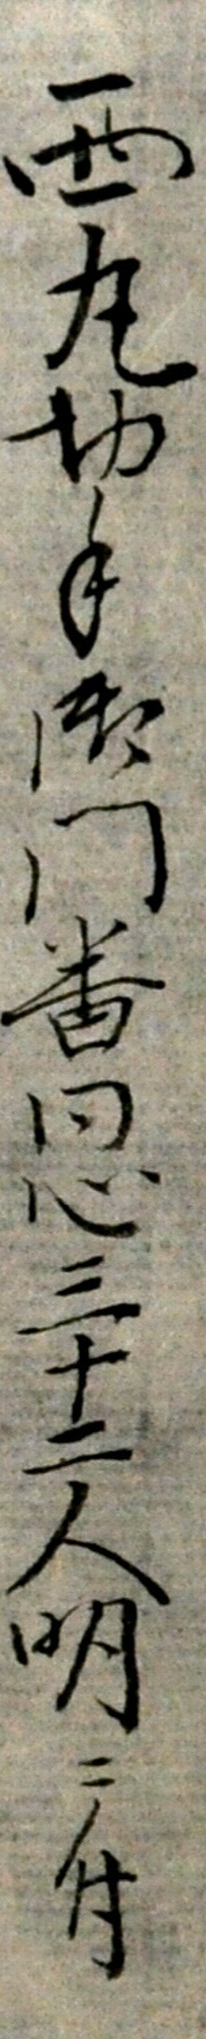西丸切手御門番同心三十二人明ニ付
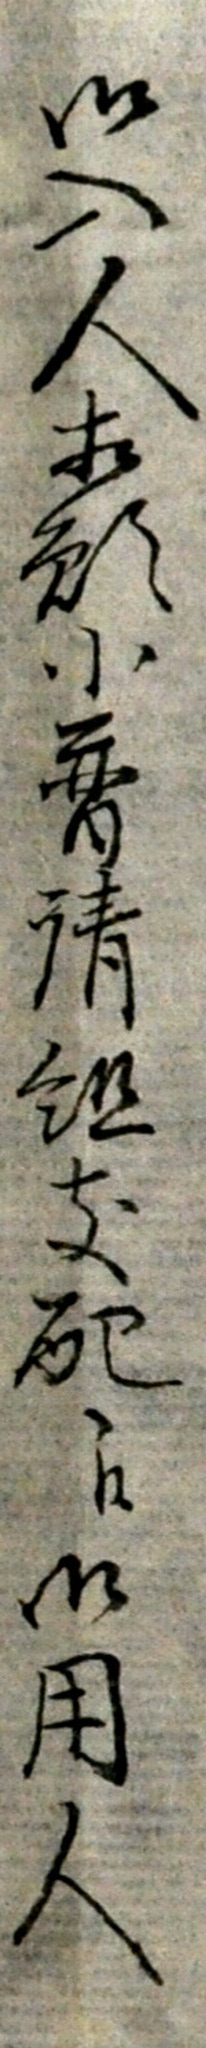御入人相願小普請組支配江御用人
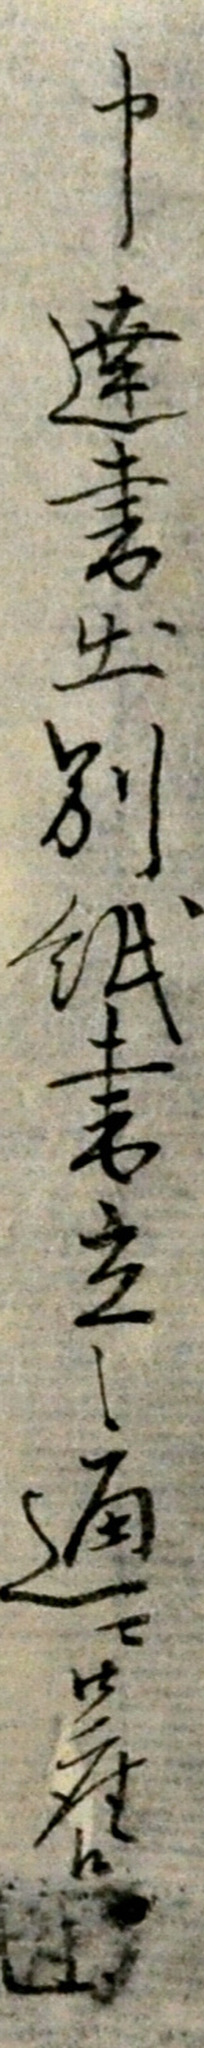申達書出別紙書立之通ニ御座候
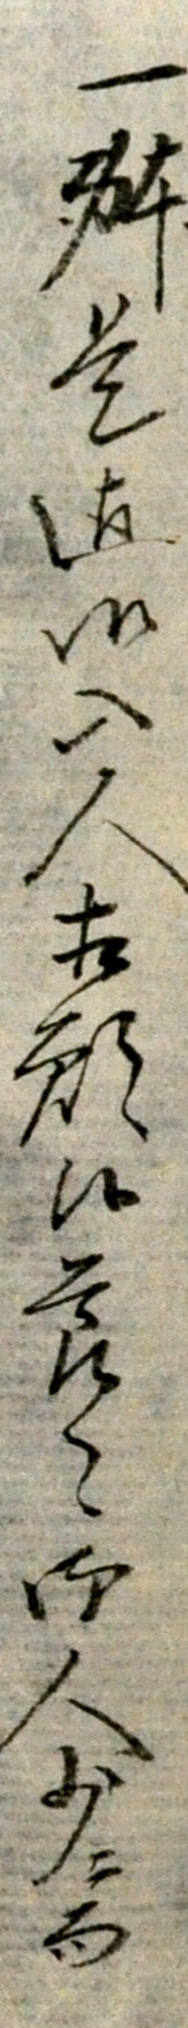一躰是迄御入人数相願候節々御人少ニ而
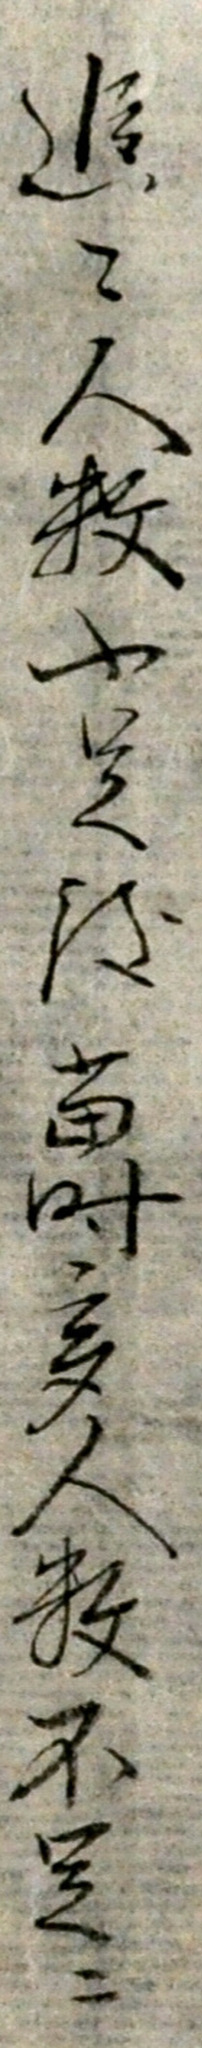追々人数不足致当時多人数不足ニ
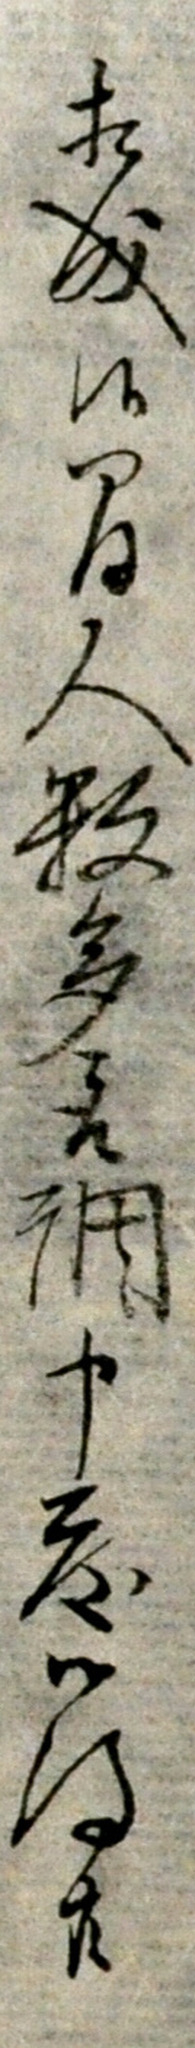相成候間人数多取調申度候得共
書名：若年寄御役中御調書付
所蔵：伊那市立高遠町図書館・合同会社AMANE
